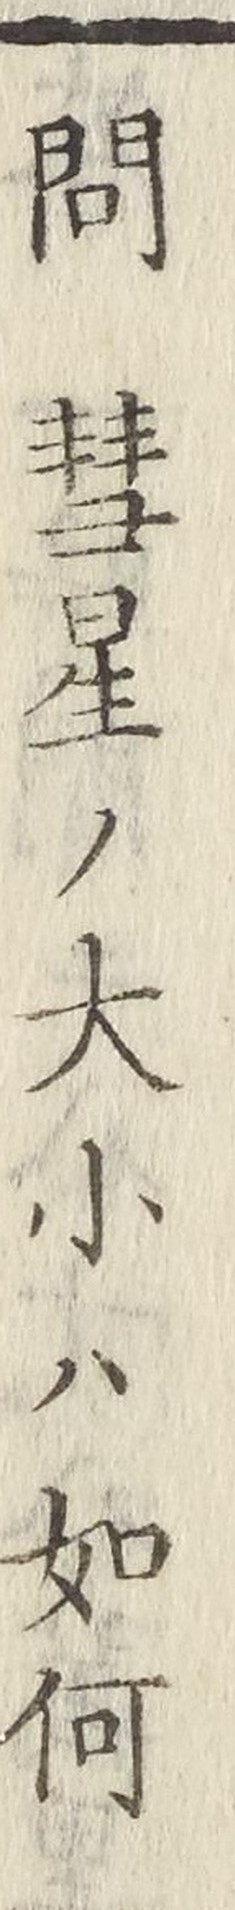問彗星ノ大小ハ如何
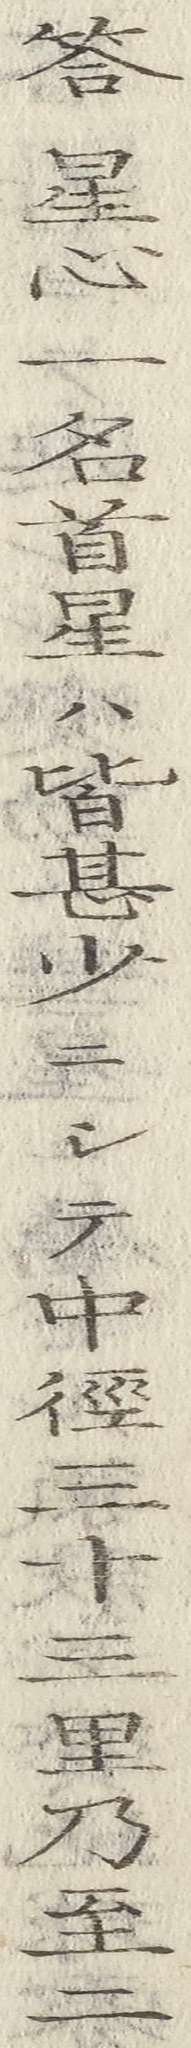答星心一名首星ハ皆甚少ニシテ中径三十三里乃ニ
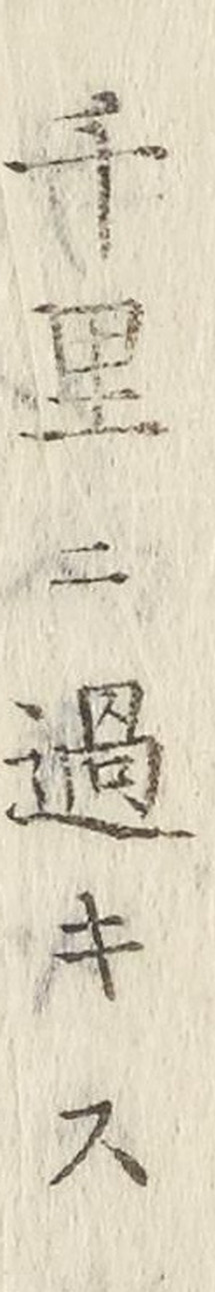千里ニ過キス
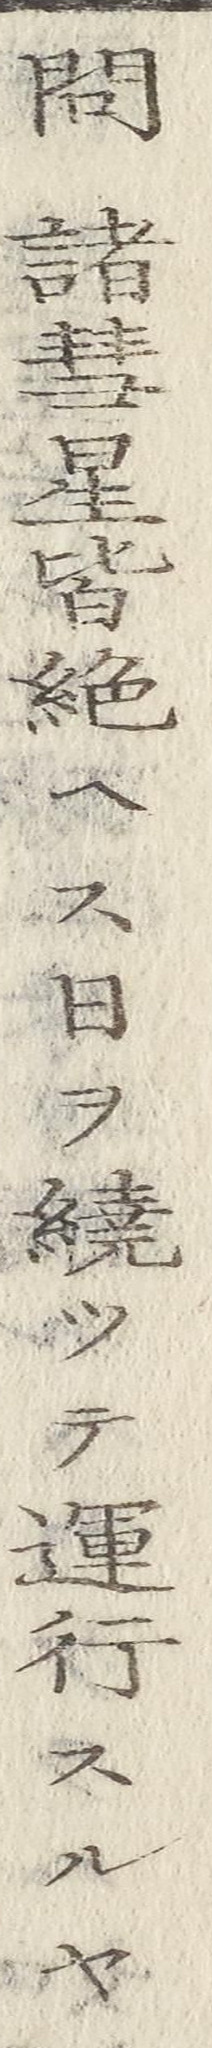問諸彗星皆絶ヘス日ヲ繞ツテ運行スルヤ
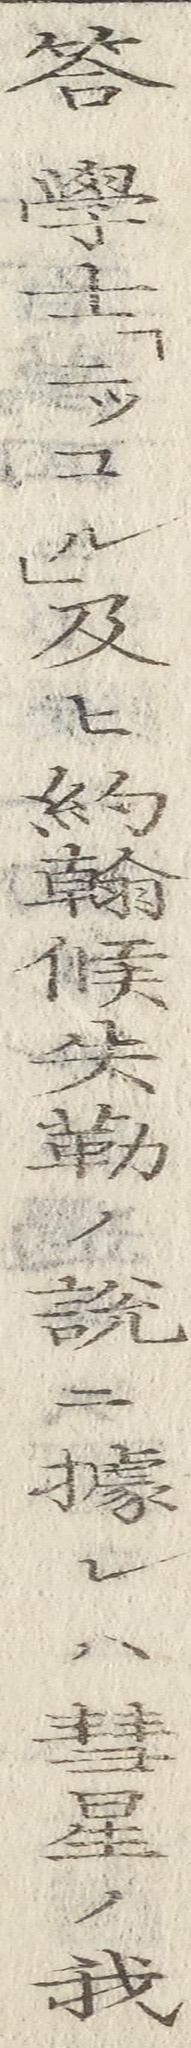答学士「ニッコル」及ヒ約翰候失勒ノ説ニ據レハ彗星ノ我
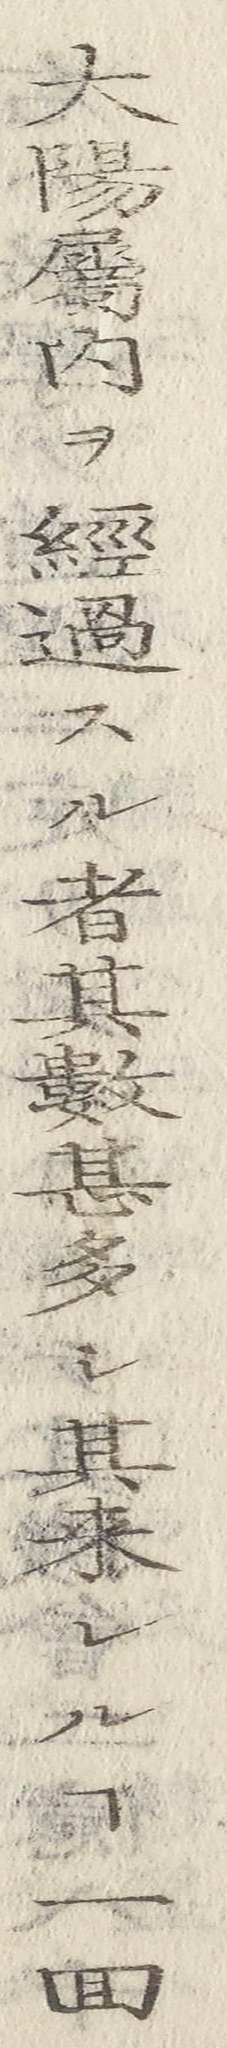大陽属内ヲ経過スル者其数甚多シ其来レルコト一回
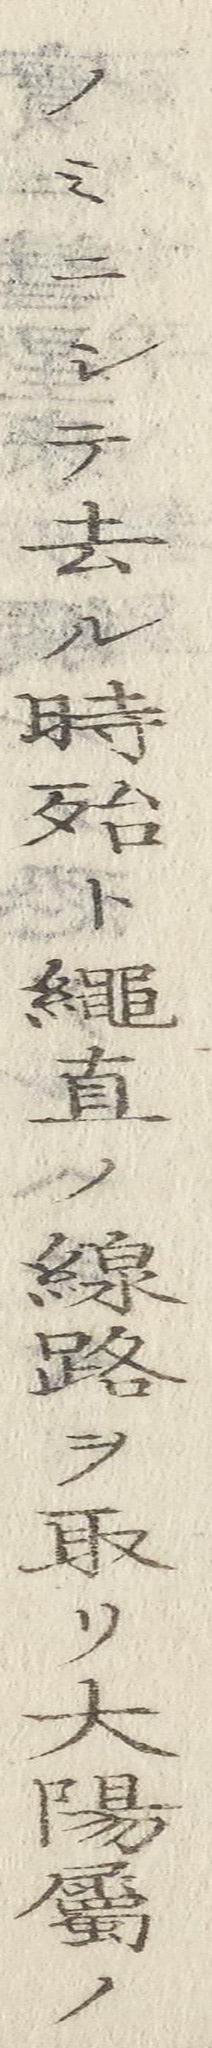ノミニシテ去ル時殆ト縄直ノ線路ヲ取リ大陽属ノ
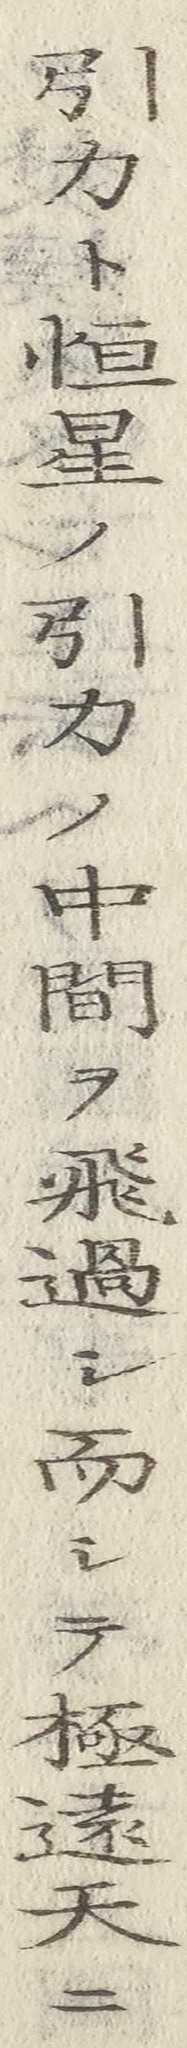引力ト恒星ノ引力ノ中間ヲ飛過ぎシ而シテ極遠天ニ
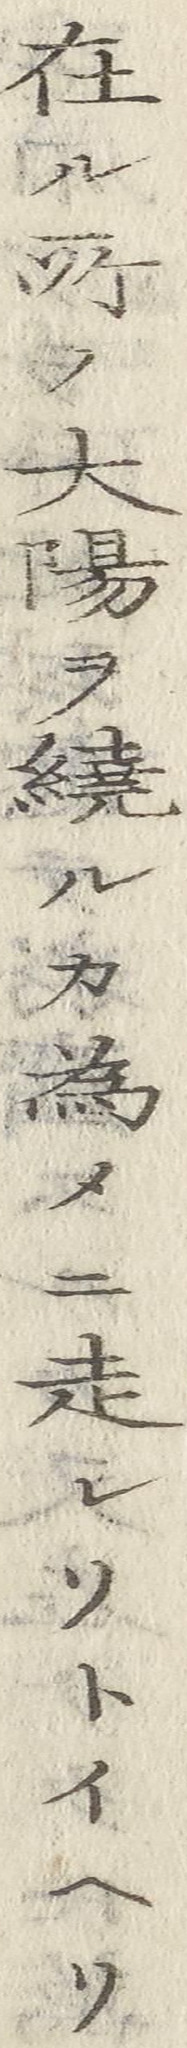在ル所ノ大陽ヲ繞ルカ為メニ走レリトイヘリ
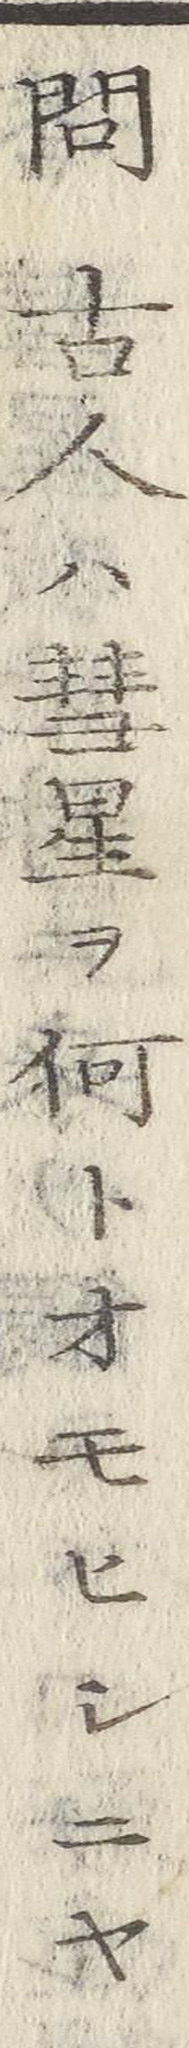問古人ハ彗星ヲ何トオモヒシ二ヤ
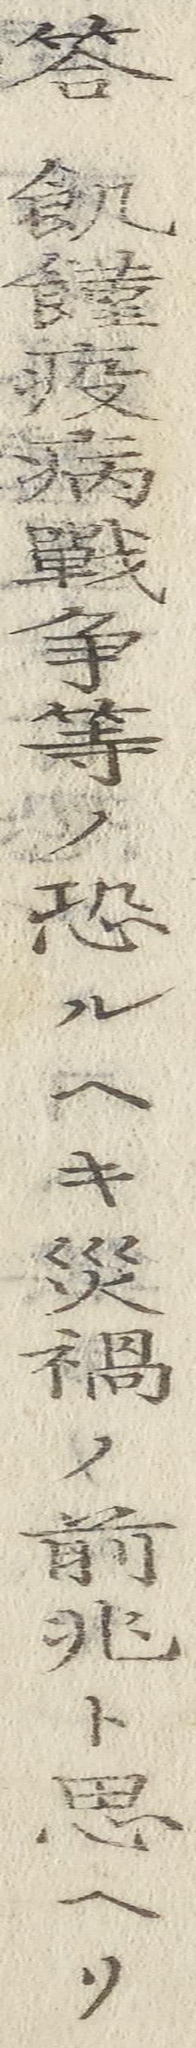答飢饉疫病戦争等ノ恐ルヘキ災禍ノ前兆ト思ヘリ

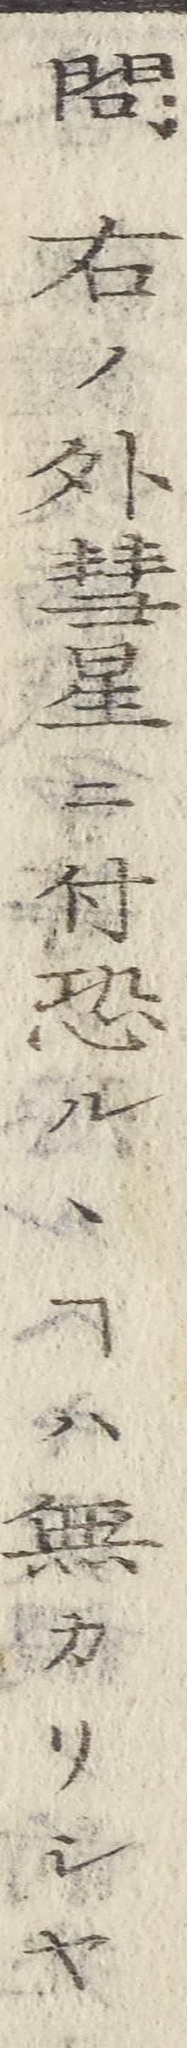問右ノ外彗星ニ付恐ルゝコトハ無カリシヤ
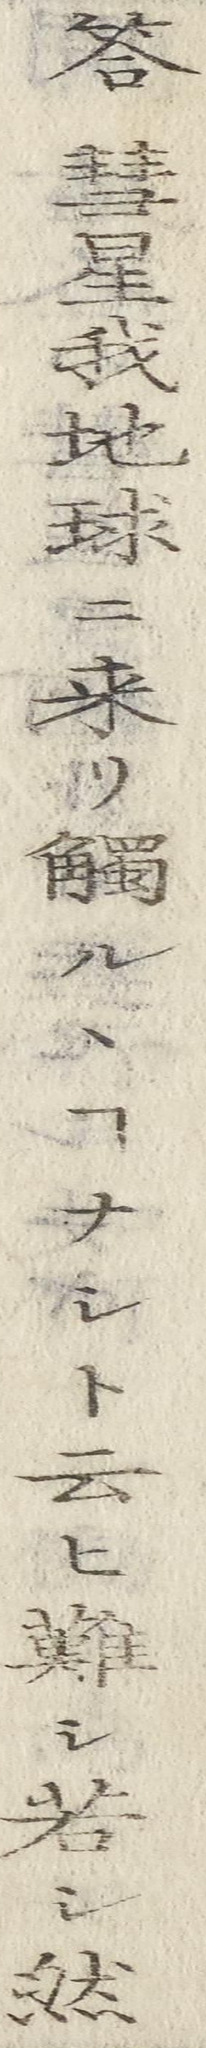答彗星我地球ニ来リ触ルゝコトナシト云ヒ難シ若シ然
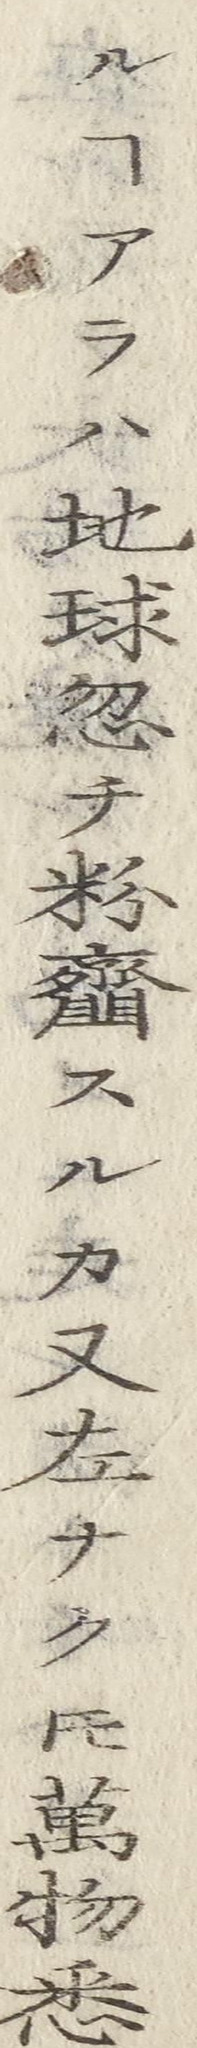ルコトアラハ地球忽チ粉齋スルカ又左ナクトモ万物悉
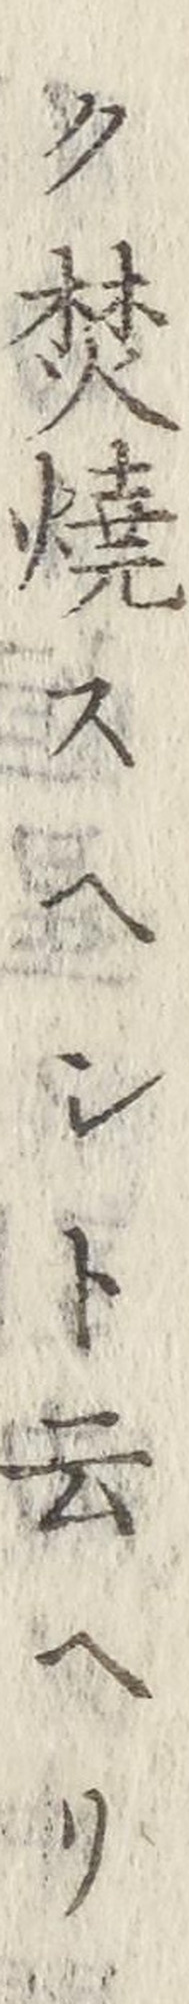ク焚焼スヘシト云ヘリ
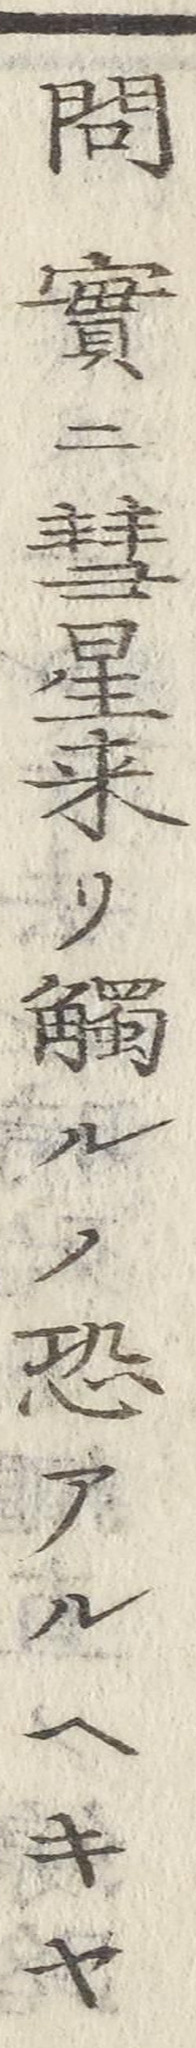問実ニ彗星来リ触ルノ恐アルヘキヤ
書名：星学圖説　下
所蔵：東京大学地震研究所図書室 Earthquake Research Institute Library, The University of Tokyo, JAPAN
